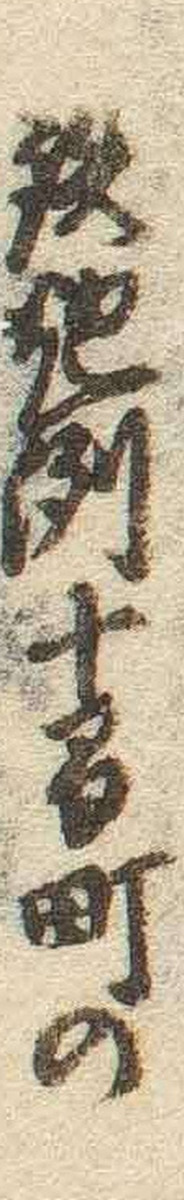佃島鉄炮洲十間町の
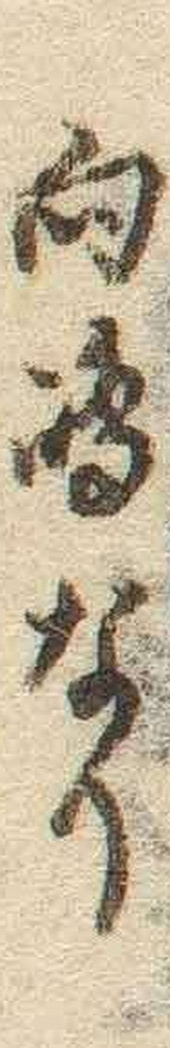向島なり
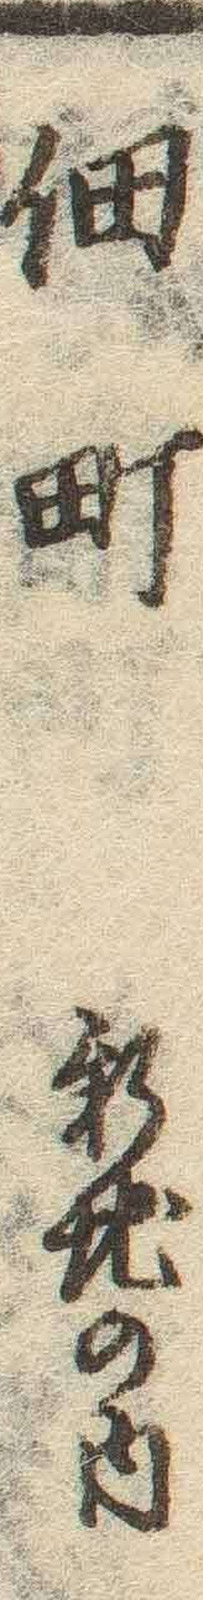佃町新地の内
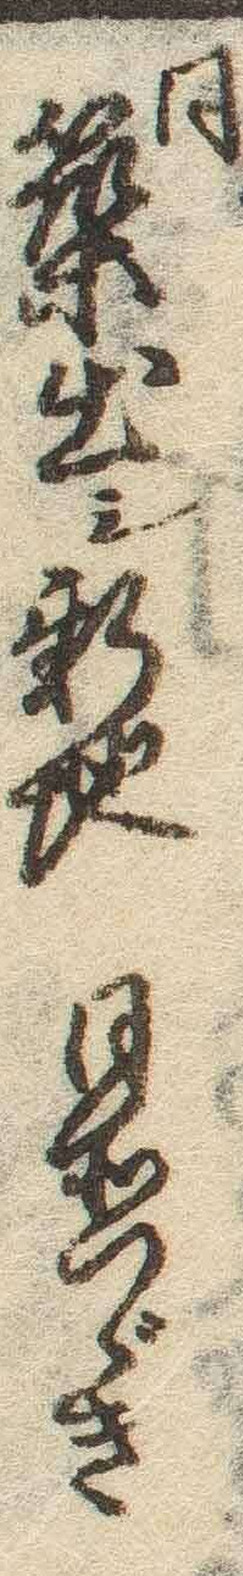築出シ新地同所つゞき
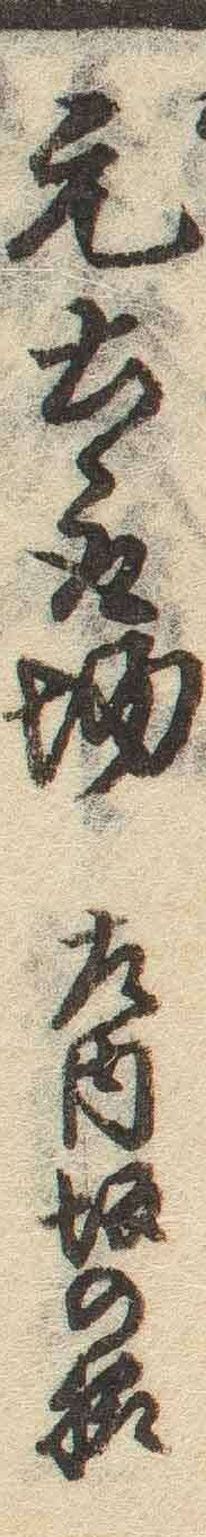元土取場左内坂の脇

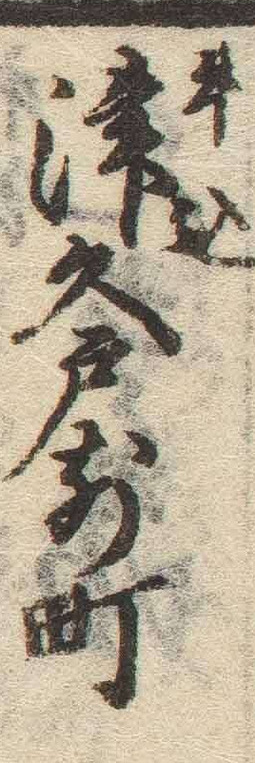津久戸前町
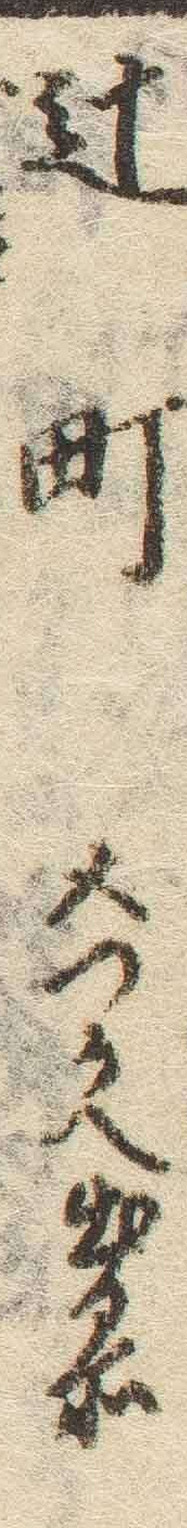辻町大つかへ出る所
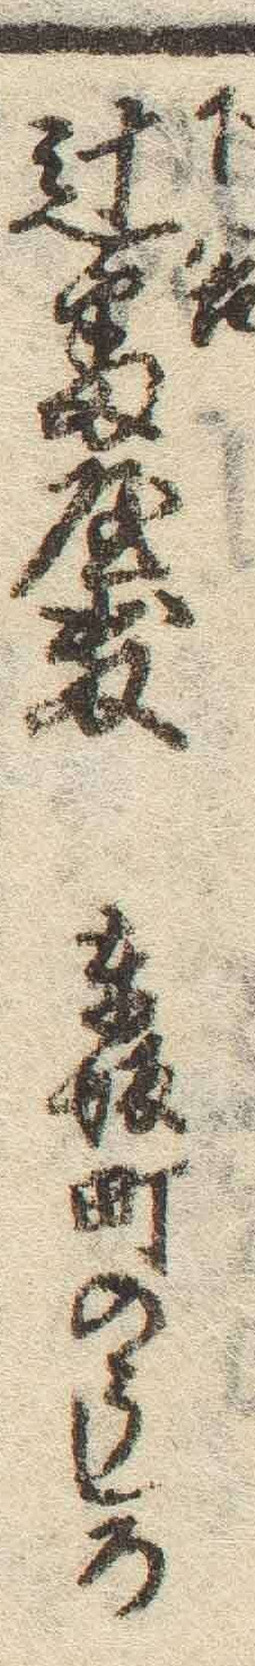辻番屋敷東坂町のうしろ
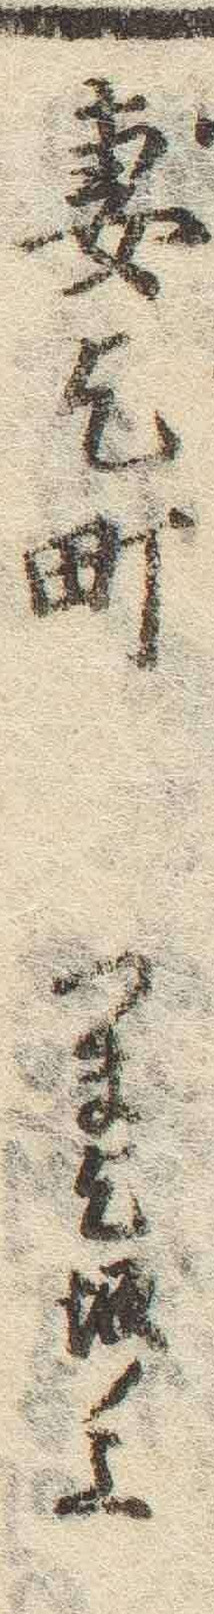妻乞町つま乞坂ノ上
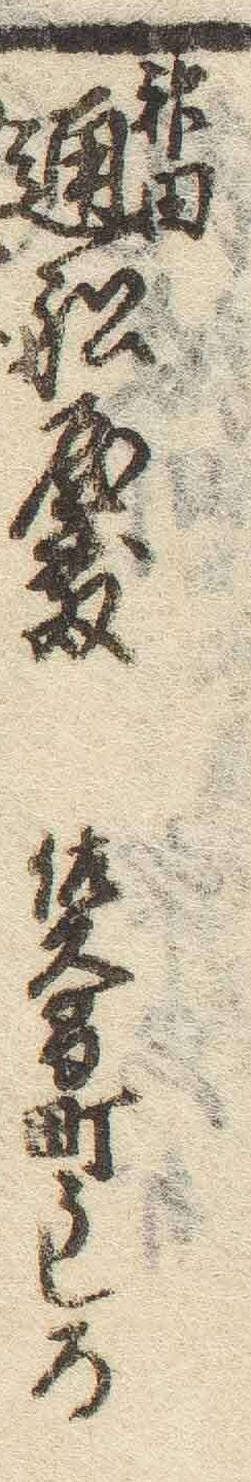通船屋敷佐久間町うしろ
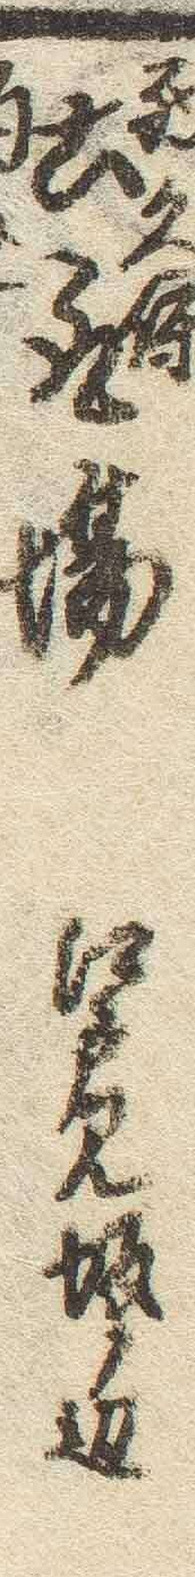土取場江戸見坂ノ辺
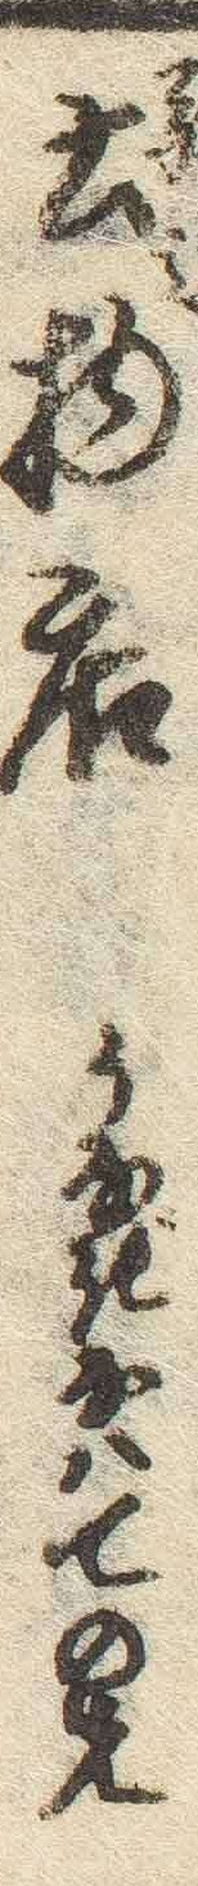土物店うなぎなはての先
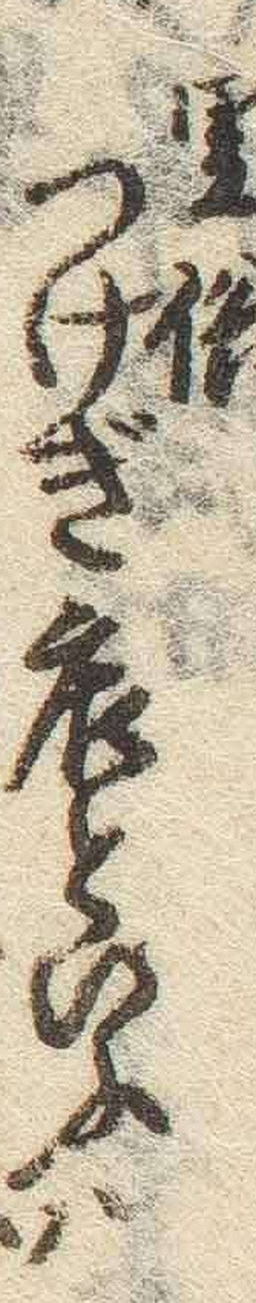つけぎ店といふは
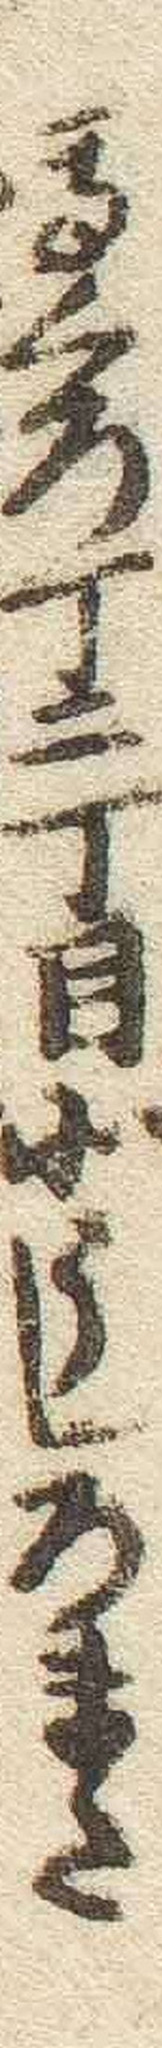馬くろ丁二丁目北うしろまた
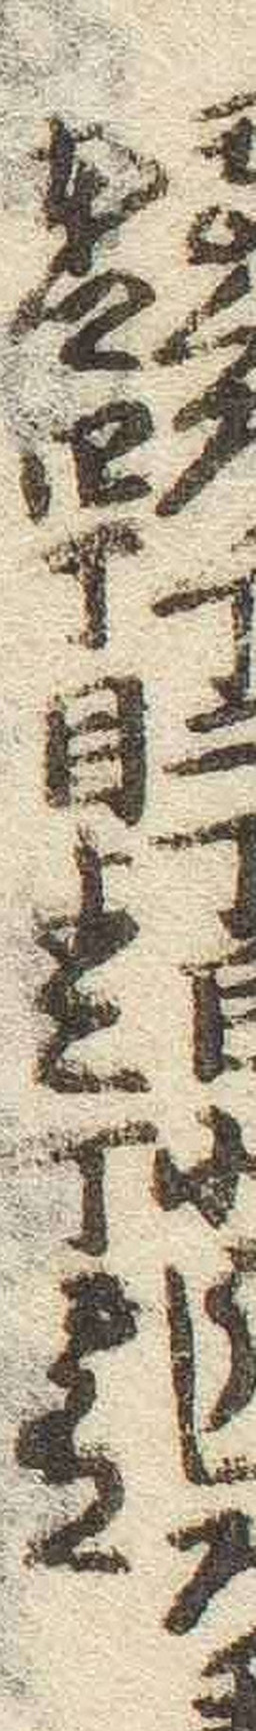本郷四丁目よこ丁に有
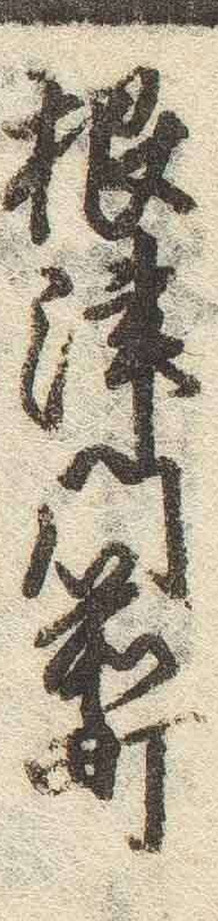根津門前町
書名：江戸町独案内
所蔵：東京学芸大学附属図書館 国文学研究資料館
